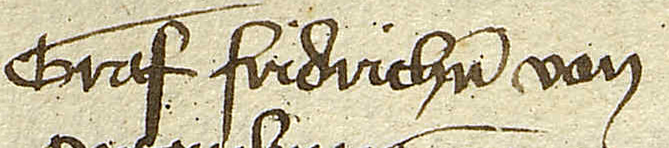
Graf fridrichn* von
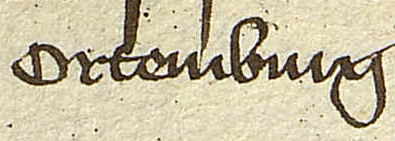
Ortemburg
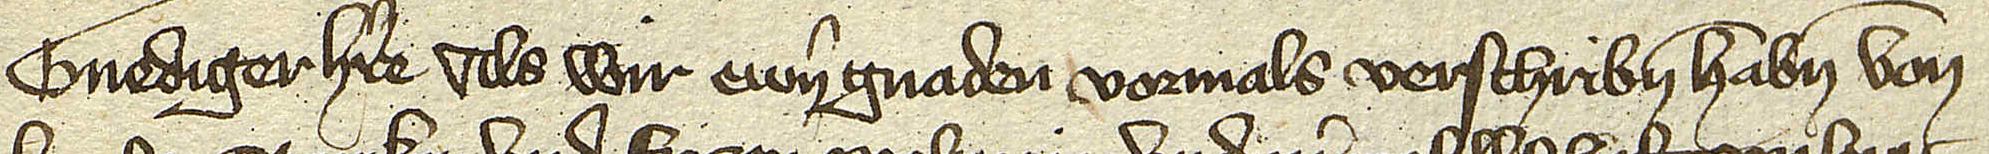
Gnediger hr*e Als wir ewn* gnaden vormals verſchribn* habn* von
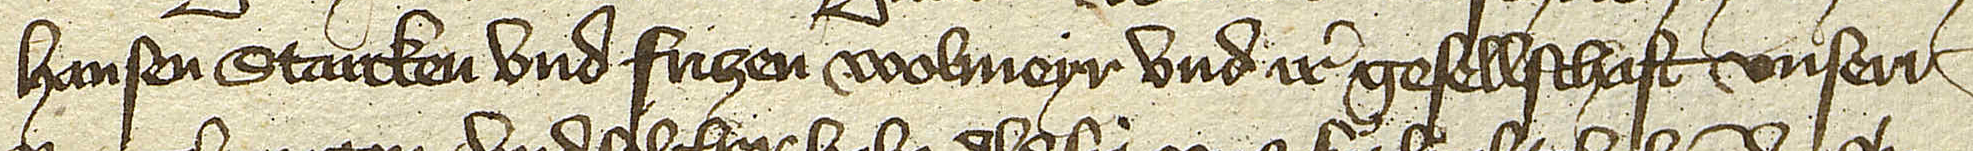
hanſen Starcken vnd fricʒen wolmeyr vnd ir* geſellſchaft vnſerr
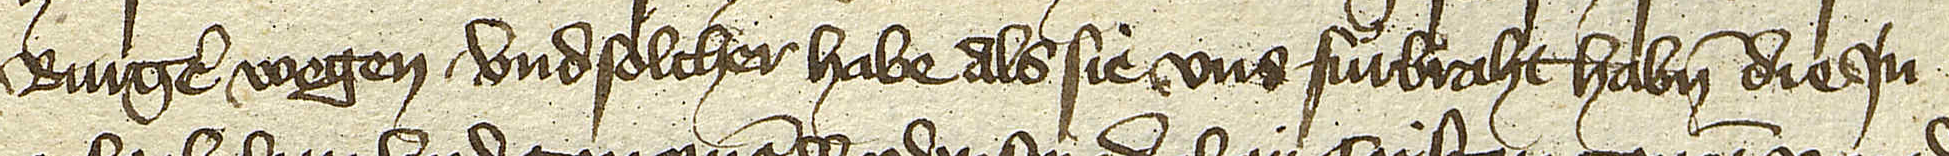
Burge* wegen / vnd ſolcher habe Als ſie vns fürbraht habn* die In
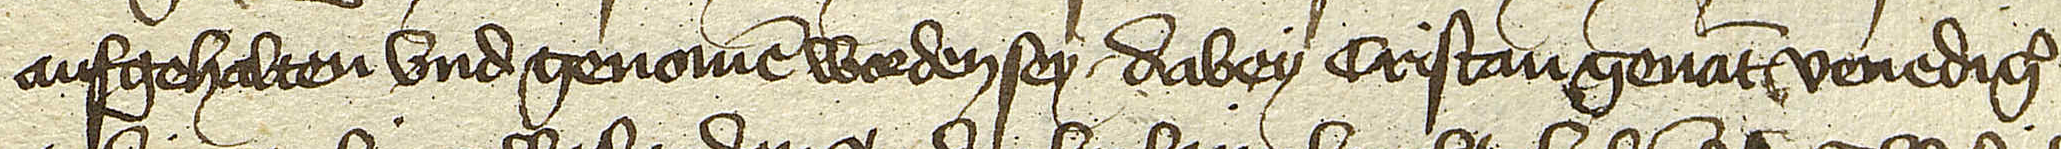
aufgehalten vnd genome* worden ſey / Dabey Criſtan genat* venedig*
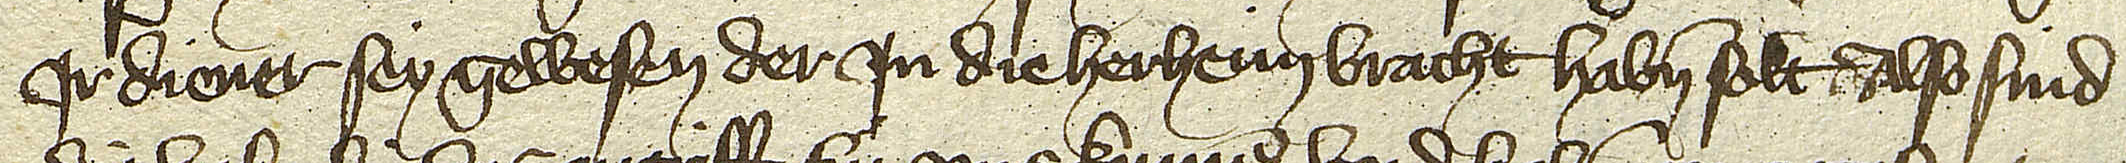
Ir diener ſey geweſen der In die herheim bracht habn* ſolt / Alſo ſind
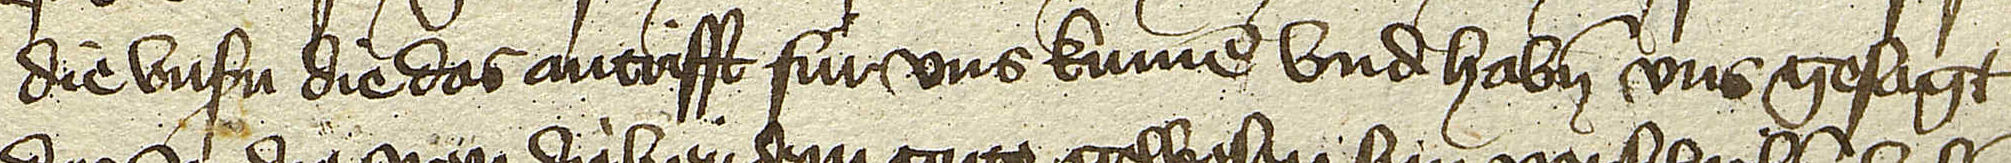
die vnſ*n die das antrifft für vns kume* vnd habn* vns geſagt
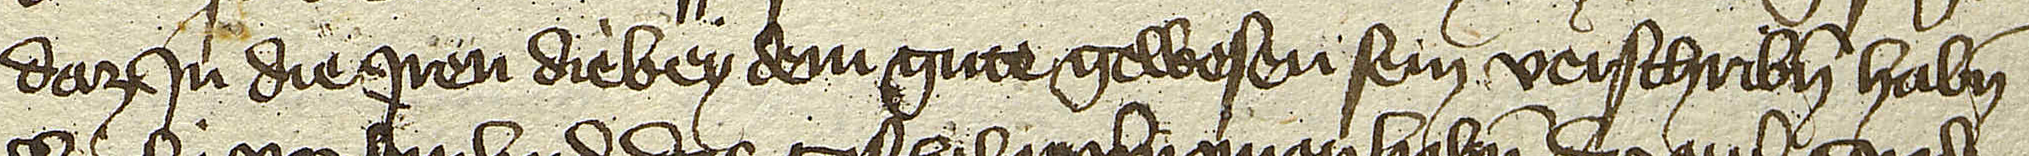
daʒ In die Iren die bey dem gute geweſen ſein verſchribn* habn*
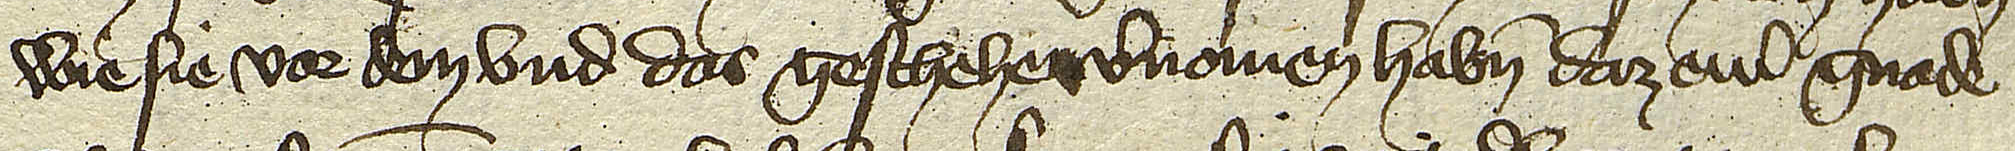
wie ſie vor dem vnd das geſchehe v*nomen habn* daʒ ew* gnade
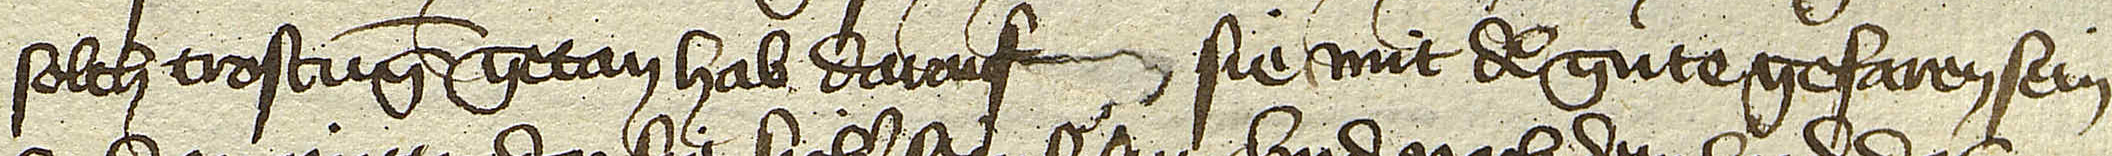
ſolch troſtug* getan hab darauf ſiie mir de* gute gefaren ſein
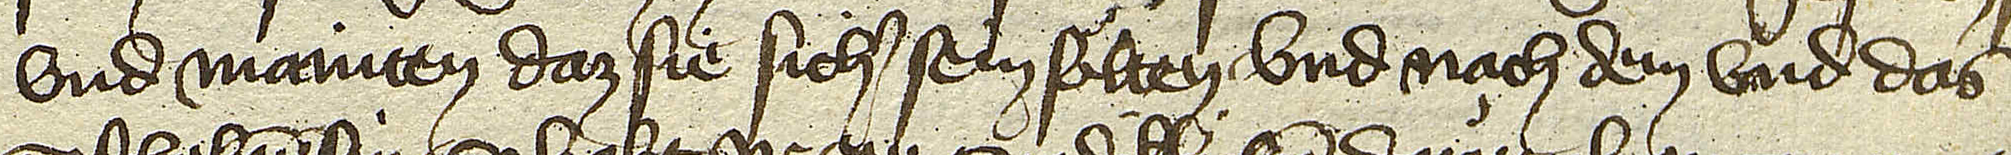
vnd mainten daʒ ſie ſich* ſein ſölten/ vnd nach dem vnd das
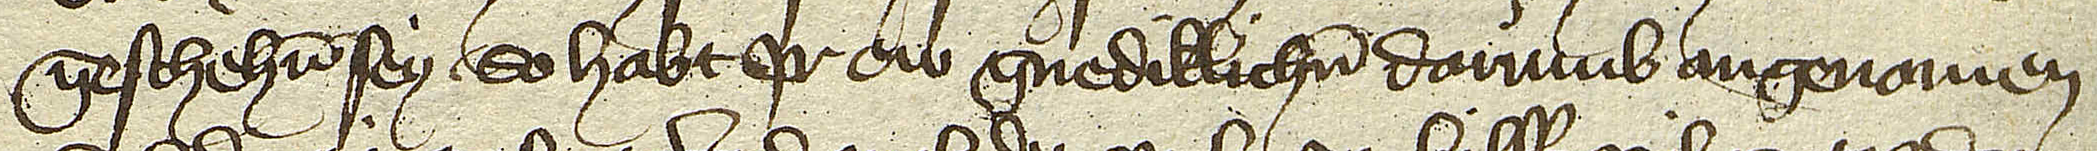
geſchehn* ſey / So habt Ir ew gnediklichn* darümb angenomen
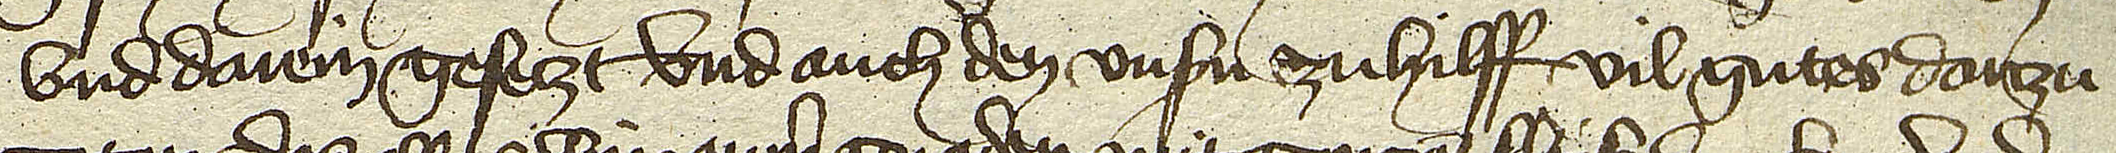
vnd darein geſecʒt vnd auch den vnſ*n cʒuhilff vil gutes darcʒu
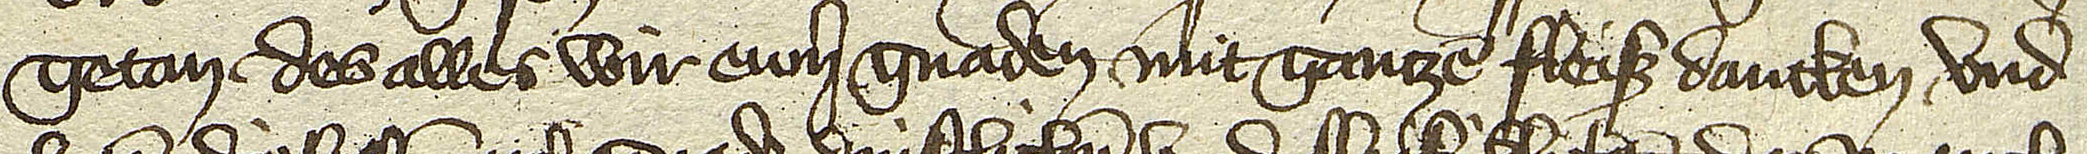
getan / des alles wir ewn* gnaden mit gancʒe* fleiſʒ dancken / vnd
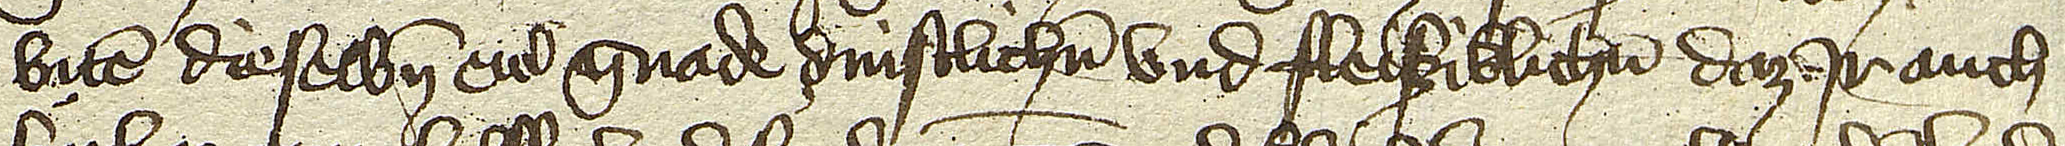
bite* dieſelbn* ew* gnade dinſtlichn* vnd fleiſʒiklichn* daʒ Ir auch
